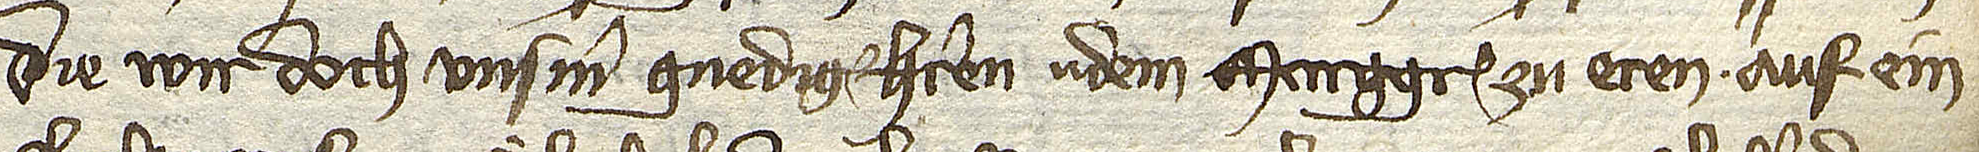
die wir doch vnſm* gnedig* h*ren ~ dem Marggr* ʒu eren . auf ein
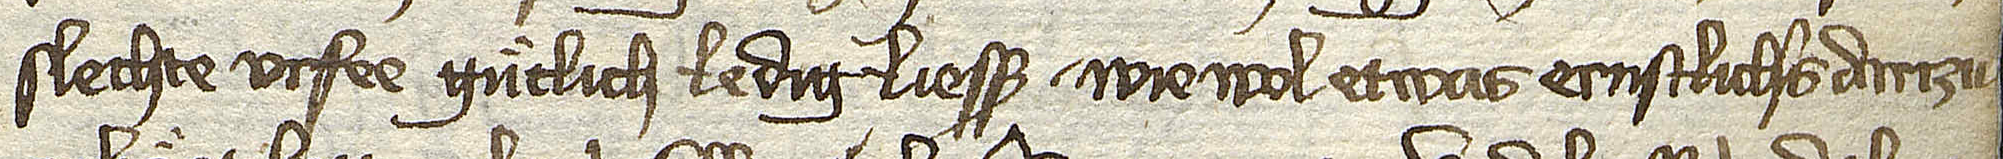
ſlechte vrfee gütlich ledig lieſſ* / wie wol etwas ernſtlich*s darcʒu
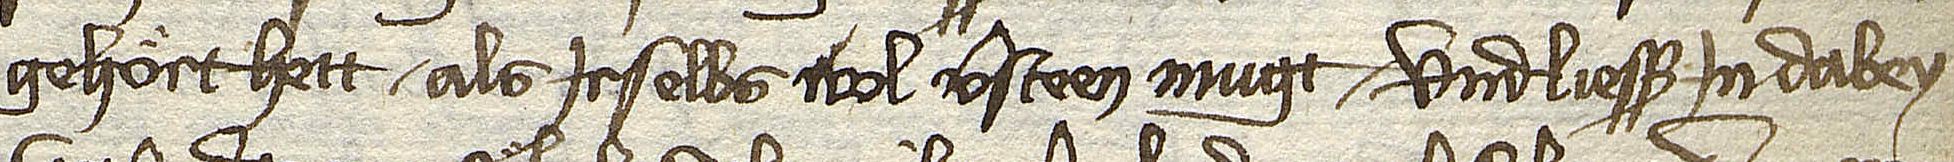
gehört hett / als Irſelbs wol v*ſteen mugt / Vnd lieſſ* In dabey
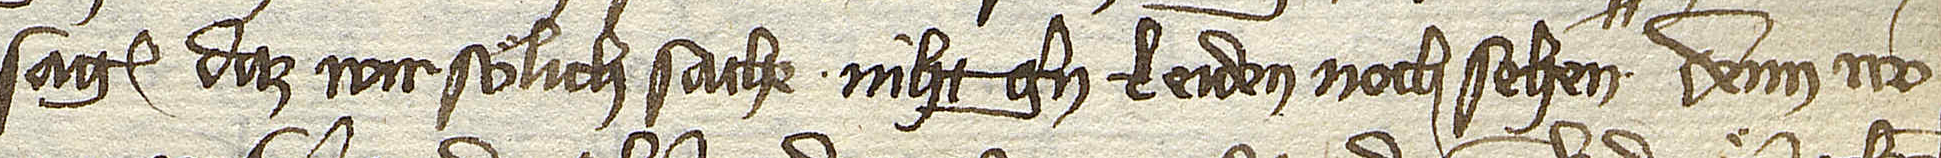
ſag* daʒ wir ſölich ſache . niht g*n leiden noch ſehen . Denn wo
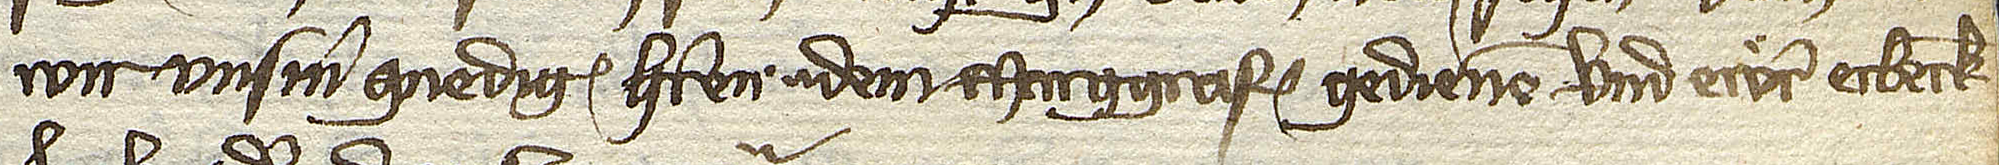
wir vnſm* gnedig* h*ren ~ dem Marggraf* gediene* Vnd eẅr* erberk*
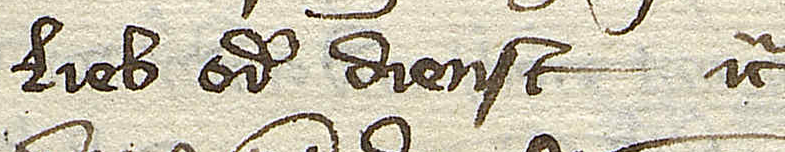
lieb od* dienſt ec*
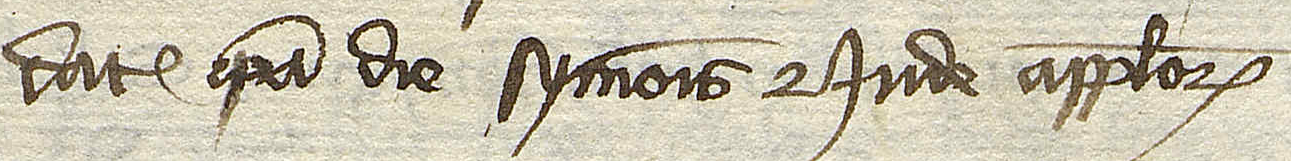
Dat* ipa* die ſymo*is @ Iude applo*
